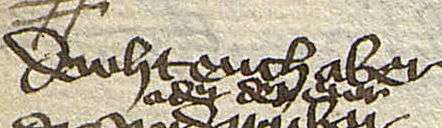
Dewht euch aber
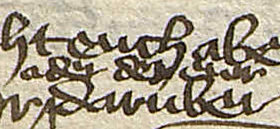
oder der ewr
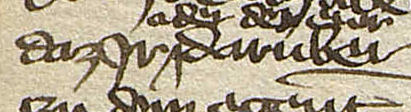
daʒ Ir darüber
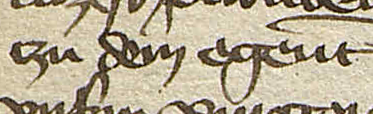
cʒu dem egent*
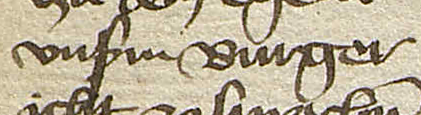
vnſ*m Burger
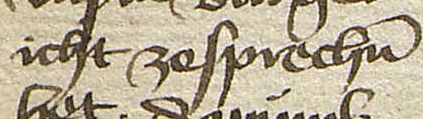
icht cʒeſprechn*
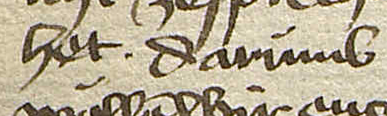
het . Darümb
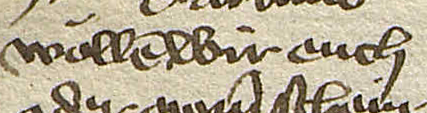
wölle* wir euch
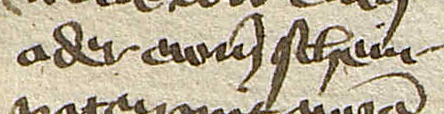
oder ewm* ſchein -
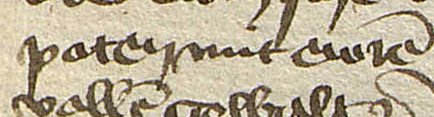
poten mit ewre*
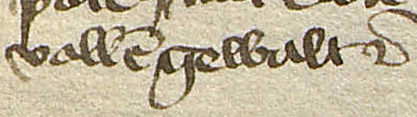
volle* gewalt ec*
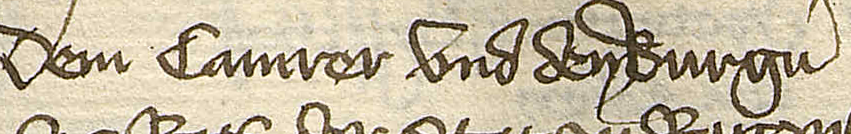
Dem Camrer Vnd den Burgn*
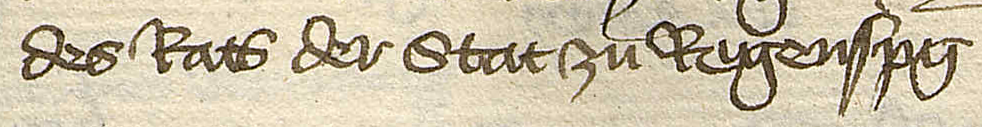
des Rats der Stat cʒu Regenſp*g
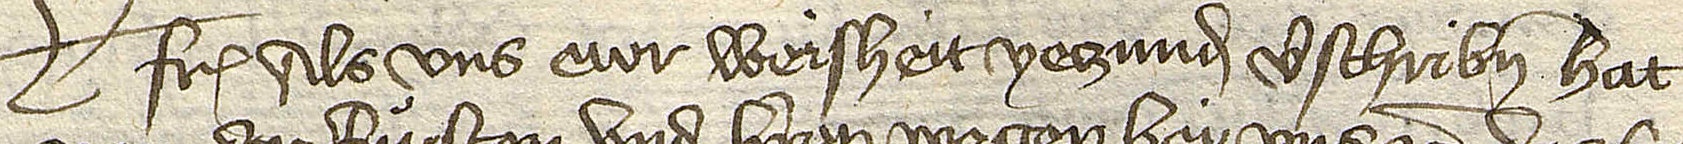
L* fr* Als vns ewr weiſheit yecʒund* v*ſchribn* hat
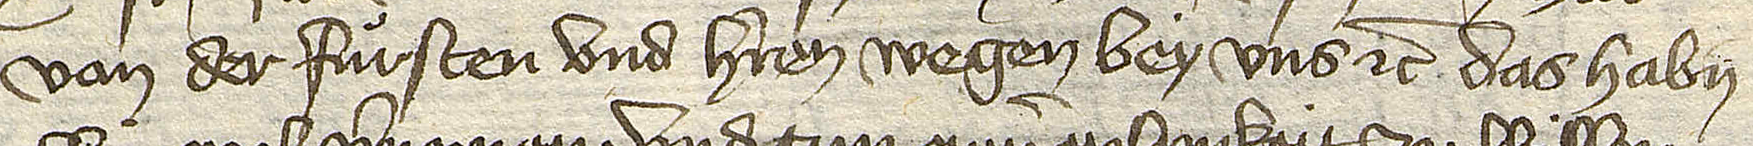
von der Fürſten vnd h*ren wegen bey vns ec* das habn*
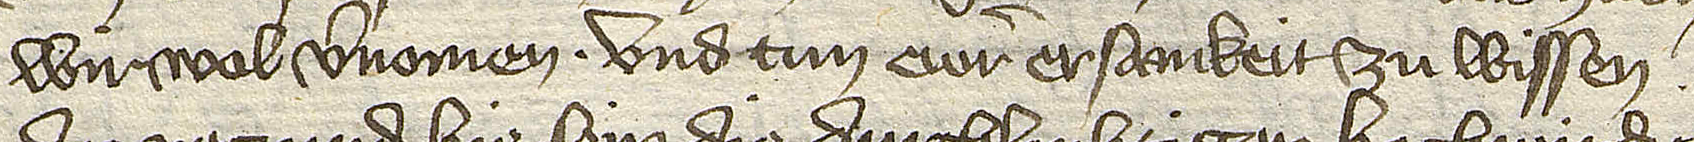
wir wol v*nomen . vnd tun ewr* erſamkeit cʒu wiſſen
